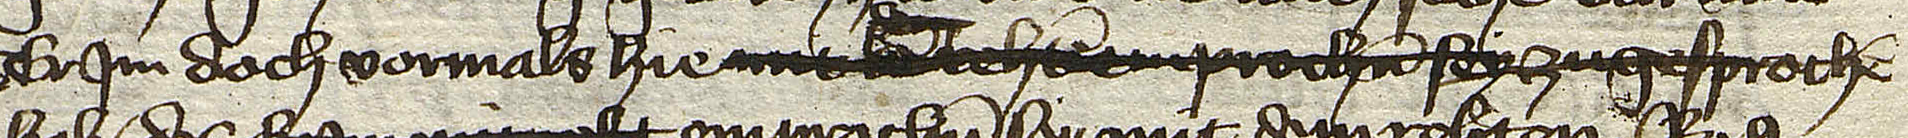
Er Im doch vormals hie mit de* rehte* einprochn* ſey cʒugeſproche*
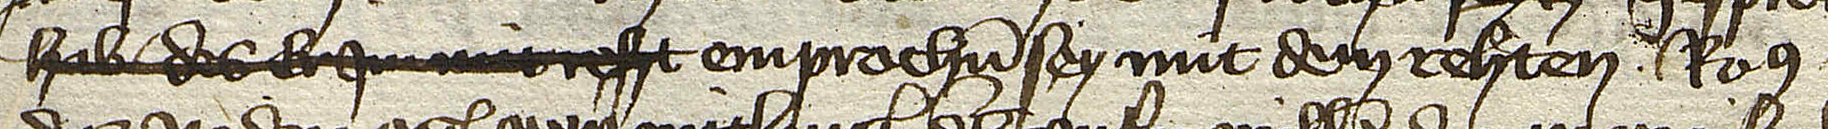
hab / des Er Im mit reht einprochn* ſey mit dem rehten . Ro*
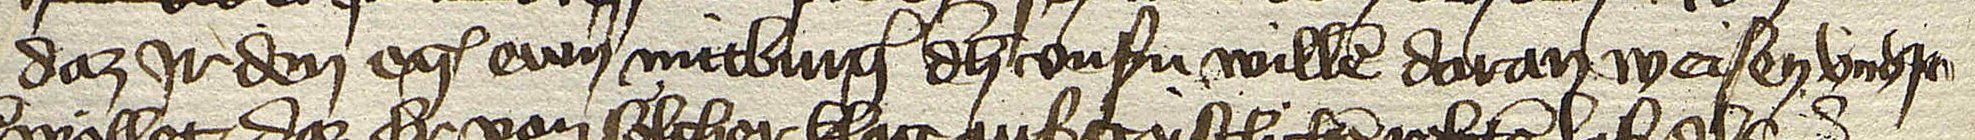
daʒ Ir den eg* ew*n mitburg* d*h vnſ*n wille* daran weiſen vnd In
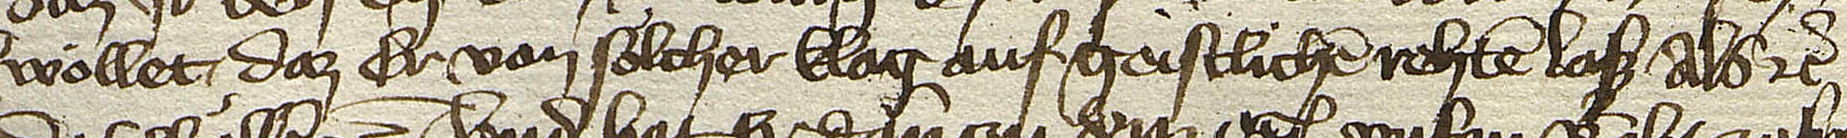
wöllet / daʒ Er von ſölcher klag auf geiſtliche* rehte* laſʒ / Als ec*
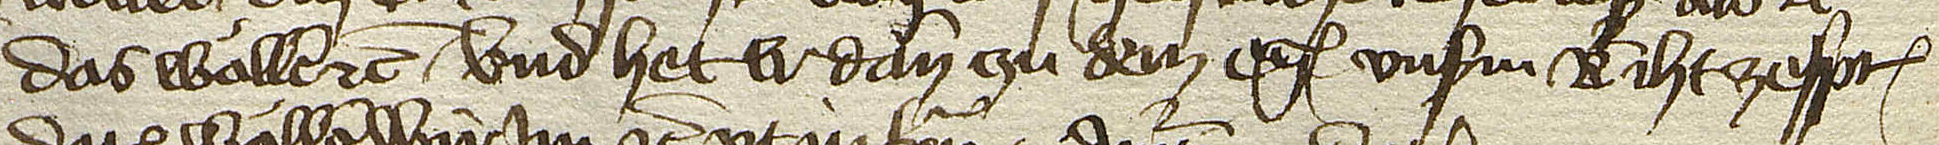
das wölle* ec* / vnd het Er dan* cʒu dem eg* vnſ*m B* iht ʒeſpr*
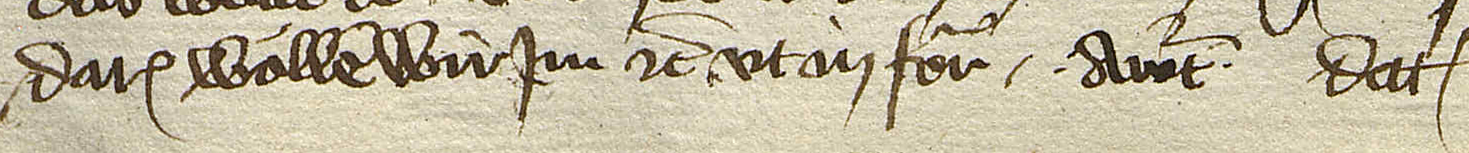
dar* wölle* wir Im ec* vt in for* / Aw*t Dat*
